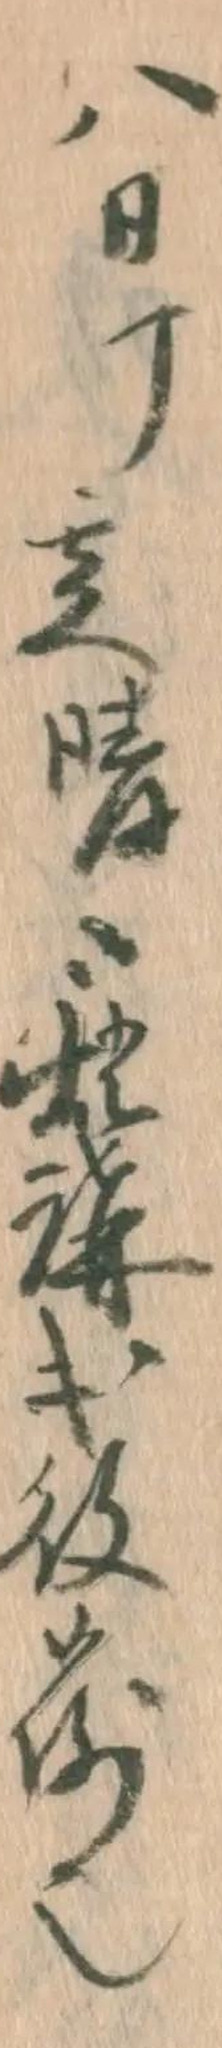八日丁亥晴御燈講出役如例也
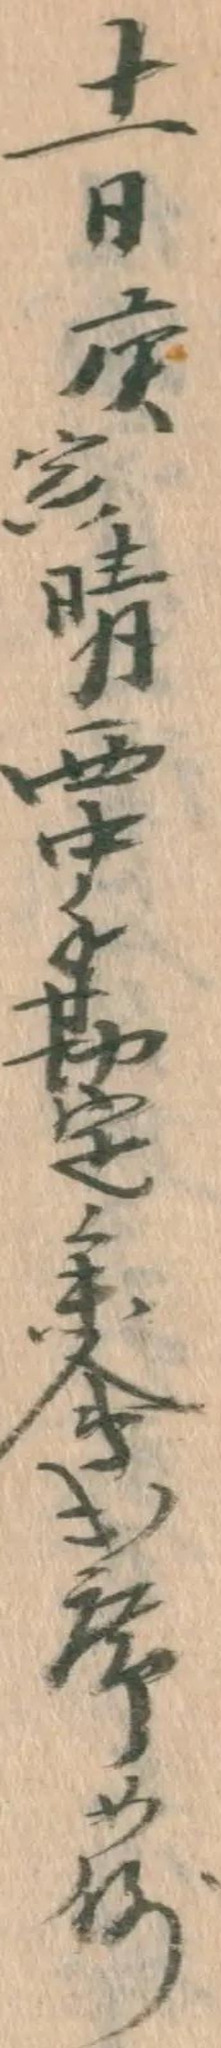十一日亥寅晴西中手勘定参會出席如例
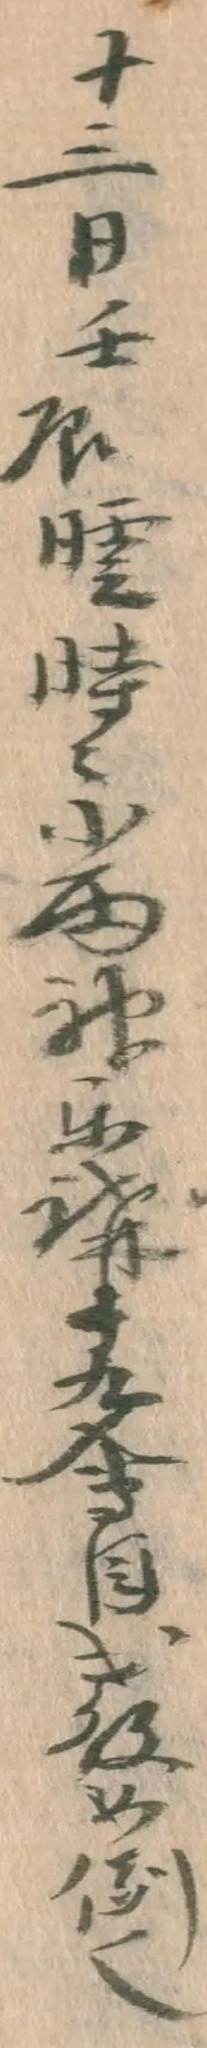十三日壬辰曇時々小雨神楽講十九會目出役如例也
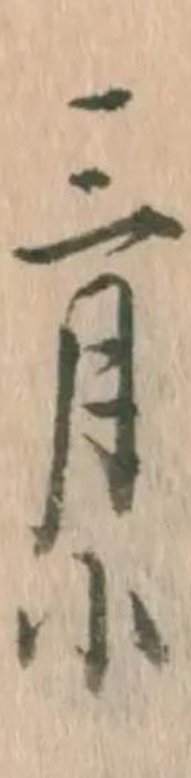三月小
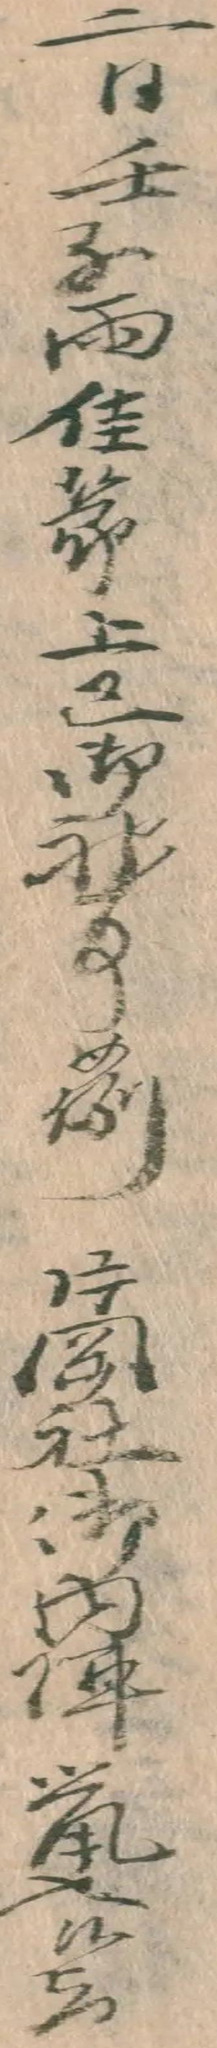三日壬子雨佳節上己御神事如例片岡社御内陣鼠入候旨
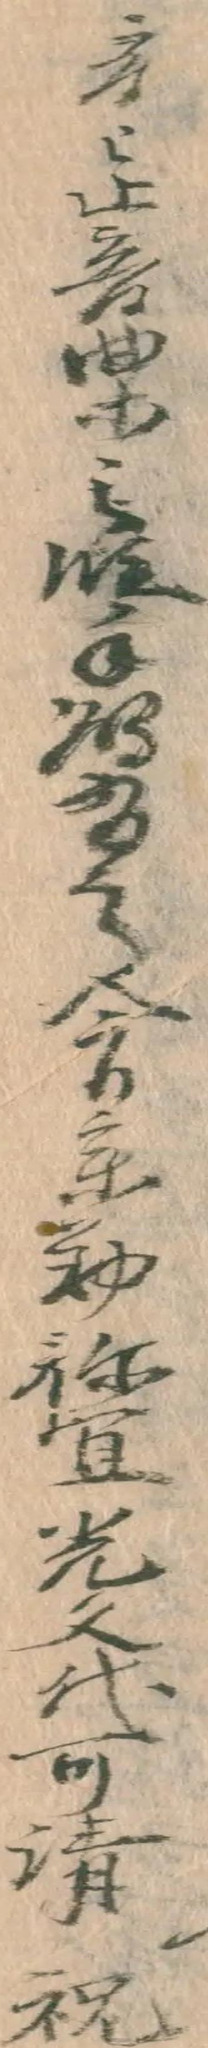ニ付被止音曲等之段手觸有之今日参勤称宜光久代可清祝
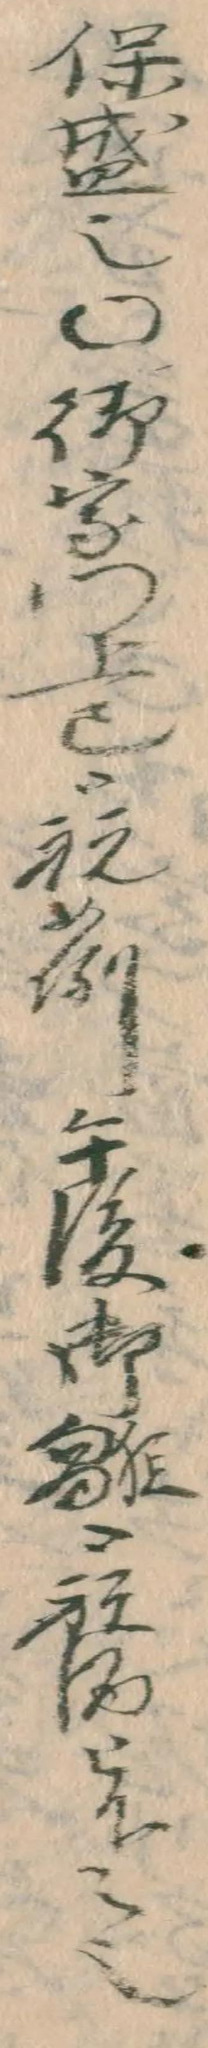保盛也○御家門上巳御祝如例午後御雛御祝酒被下之也
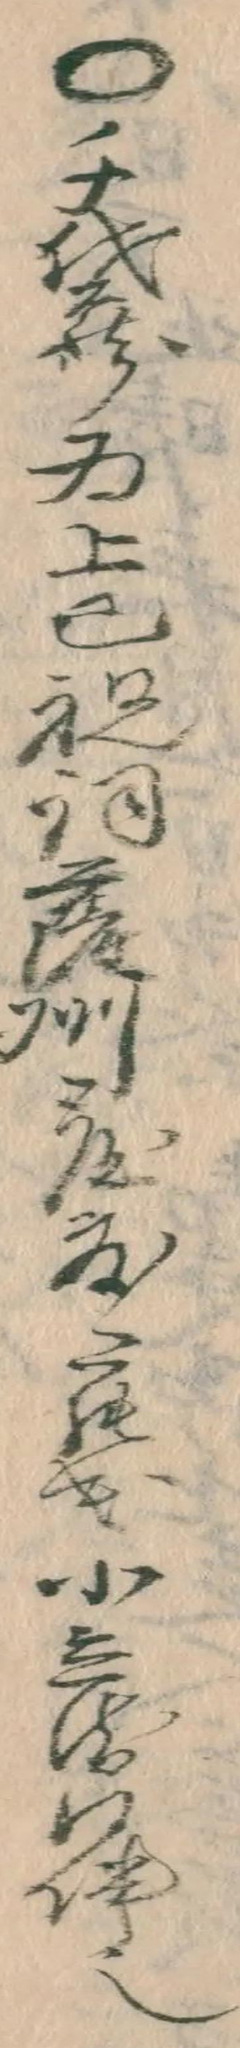○千代蔵為上己祝詞薩州屋敷へ罷出小兵衛同伴也
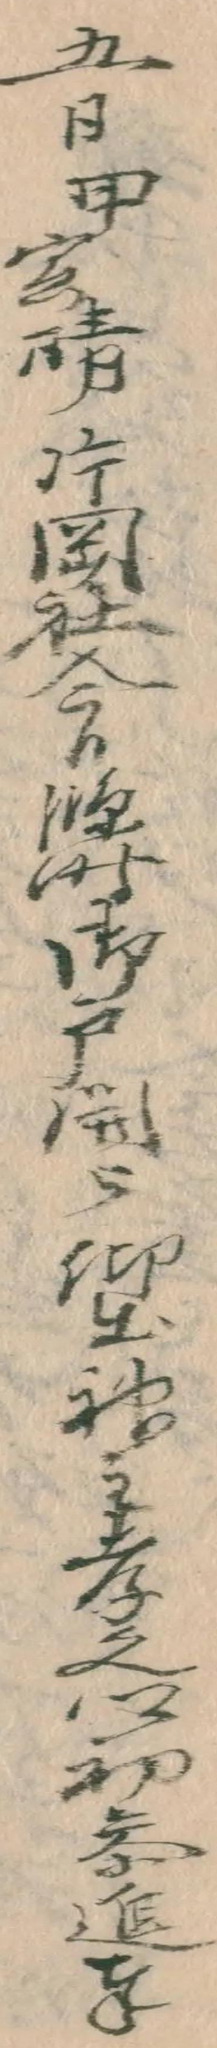五日甲寅晴片岡社協臨時御戸開被仰出神主孝之卿初参進奉
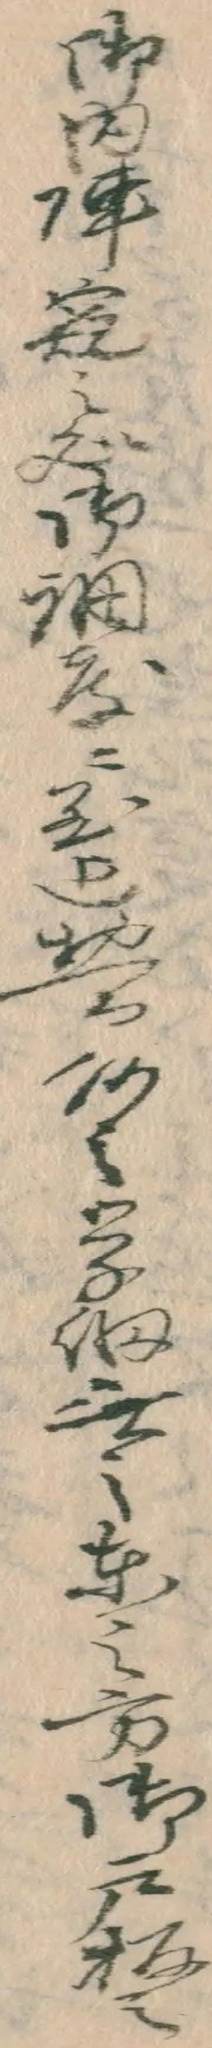御内陣窺之処御調度ニ至迄惣而何之御子細無之東之方御戸板之
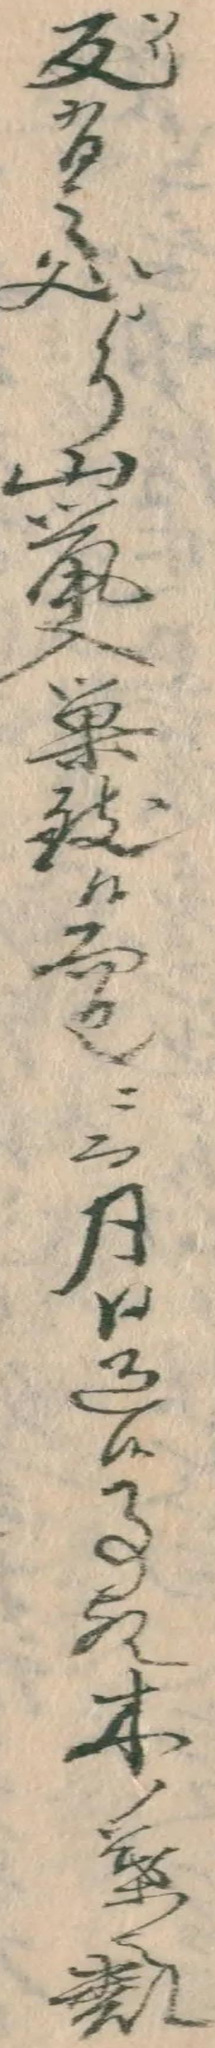反有之処より山鼠入巣致候而巳ニ而月日過候事歟木ノ葉之類
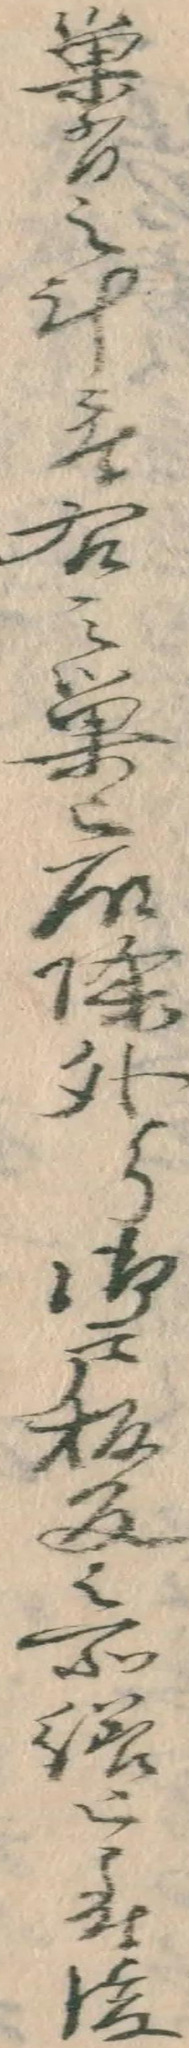巣有之斗ニ付右之巣被除外より御戸板反之所繕被申付後
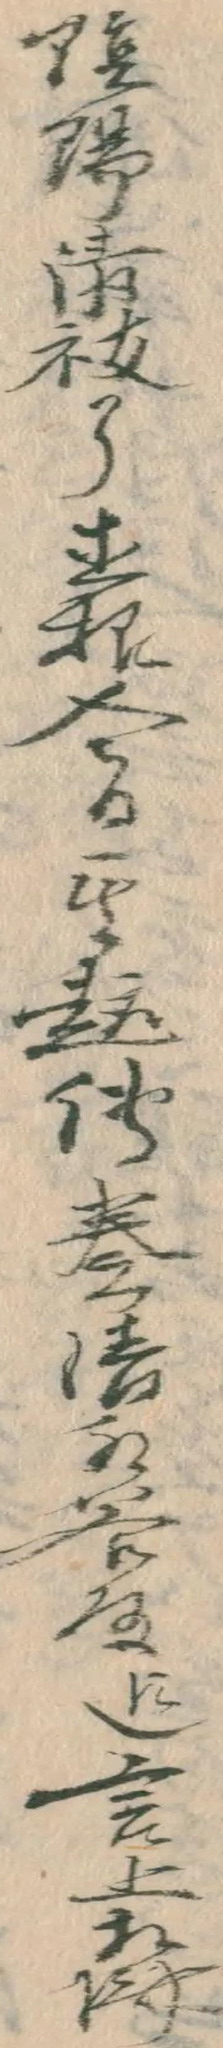陰陽清祓了直様今日其趣傳奏清水谷殿迄言上相済
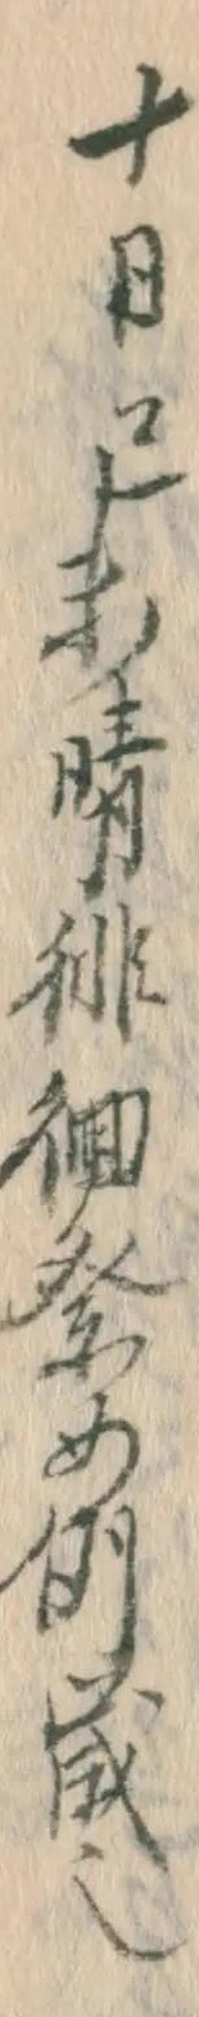十日巳未晴徘徊祭如例歳也
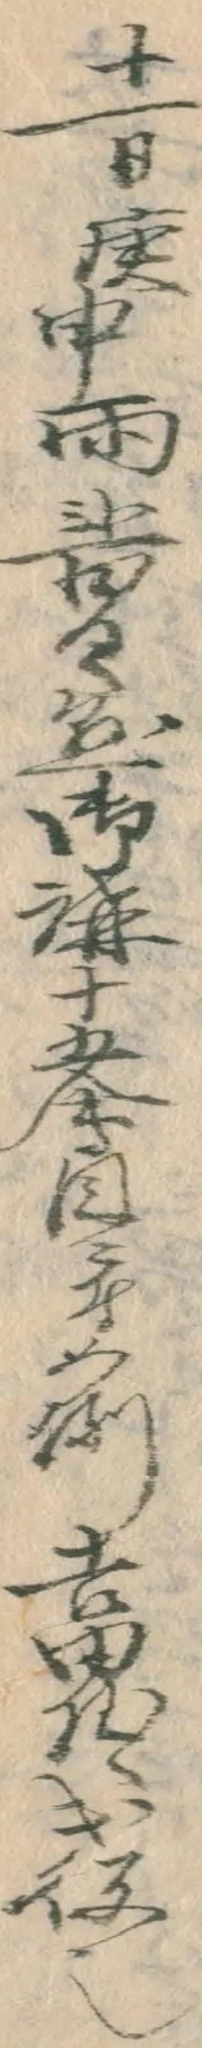十一日庚申雨弐百匁懸御講十五會目ニ付如例吉田屋へ出役也
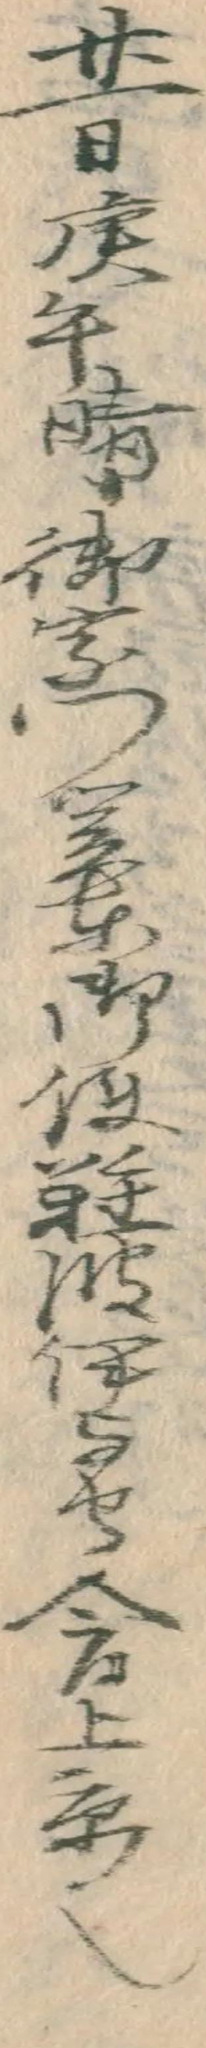廿一日庚午晴御家門関東御使難波伊与守今日上京也
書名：賀茂社記録. 第69冊
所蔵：国立国会図書館 National Diet Library, JAPAN
